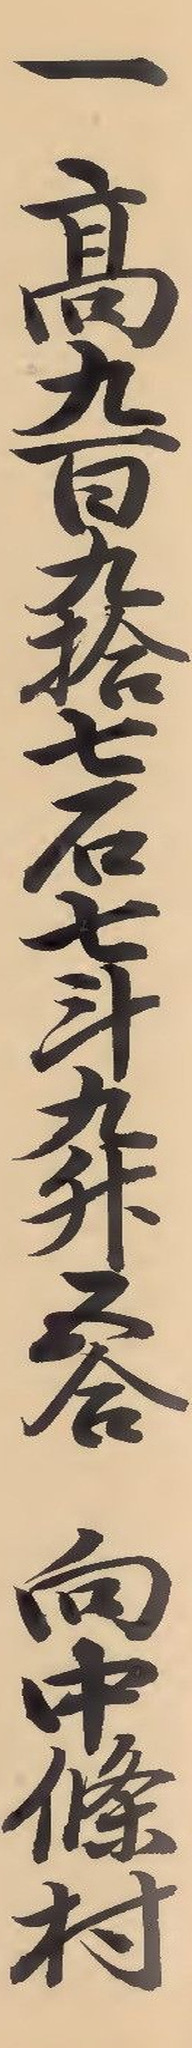一高九百九拾七石七斗九升五合向中条村
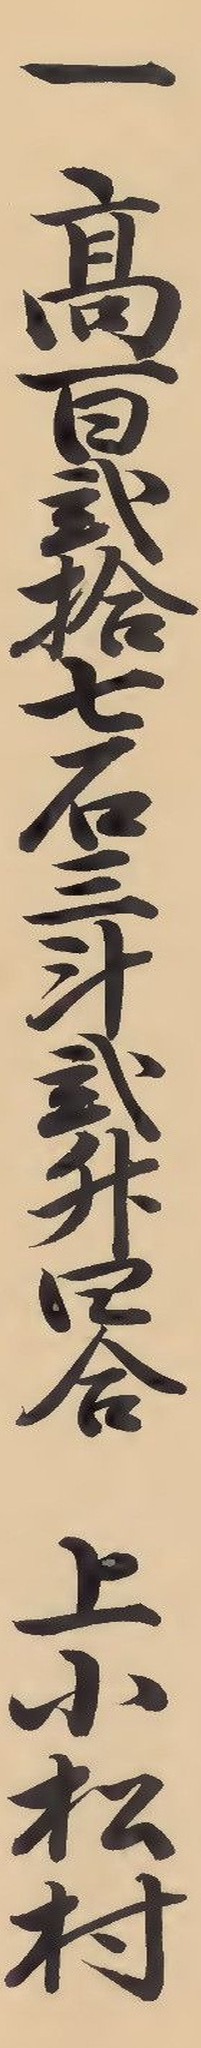一高百弐拾七石三斗弐升四合上小松村
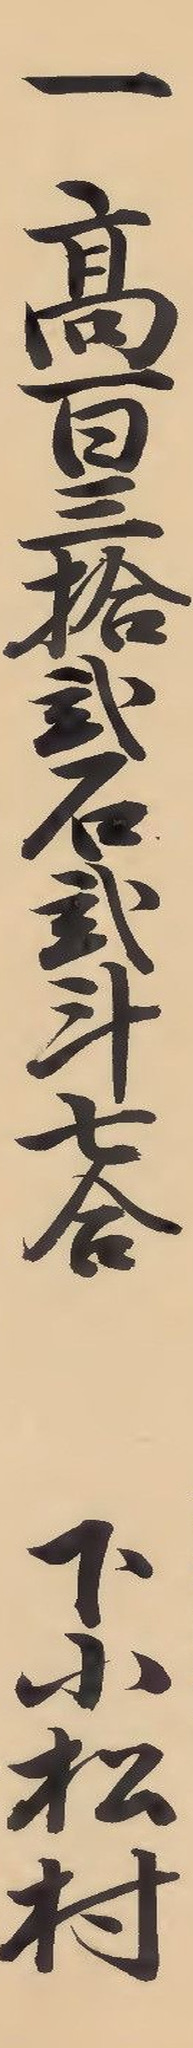一高百三拾弐石弐斗七合下小松村
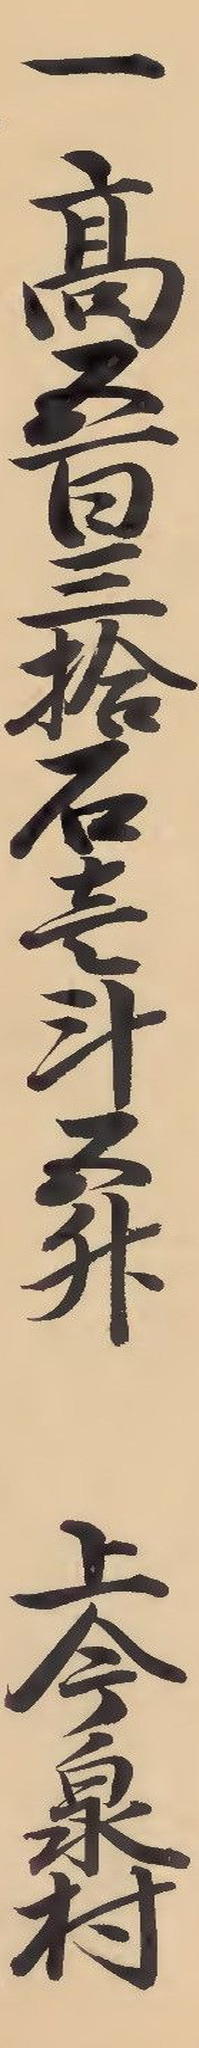一高五百三拾石壱斗五升上今泉村

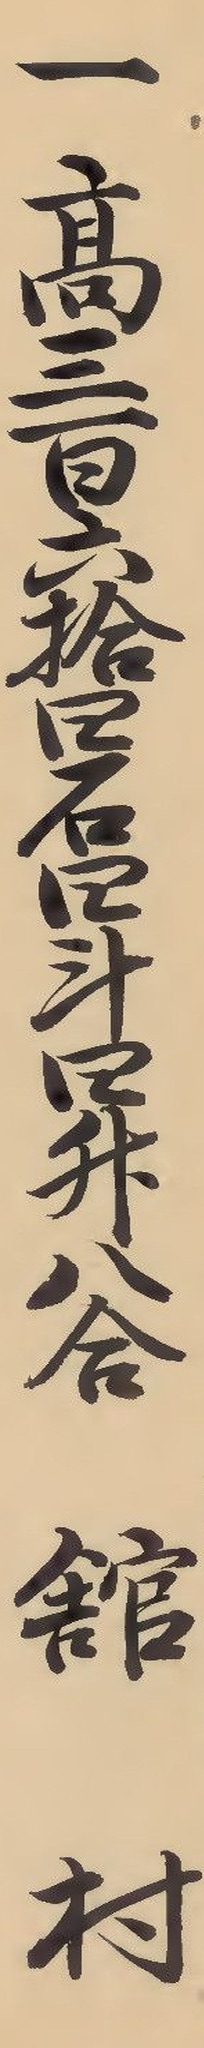一高三百六拾四石四斗四升八合舘村
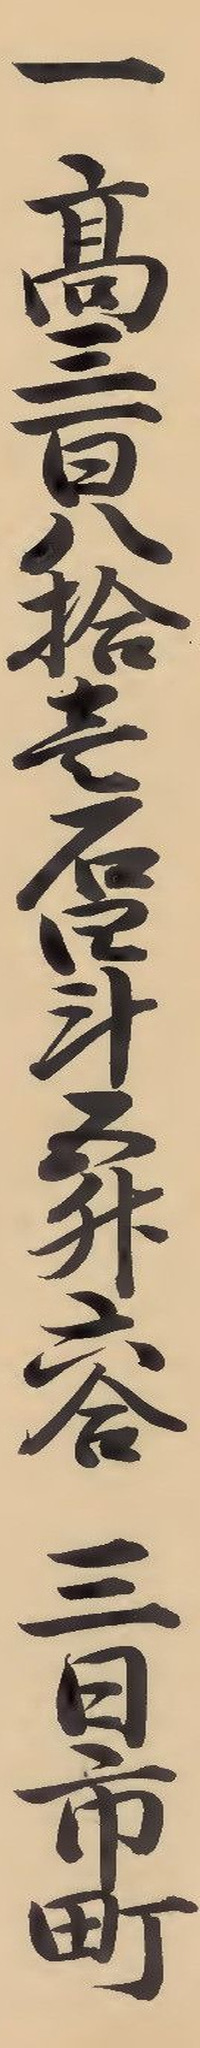一高三百八拾壱石四斗五升六合三日市町
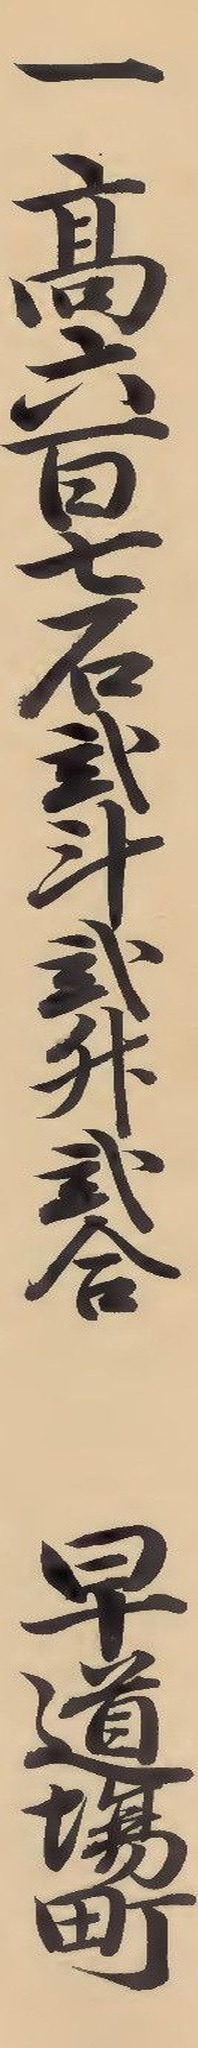一高六百七石弐斗弐升弐合早道場町
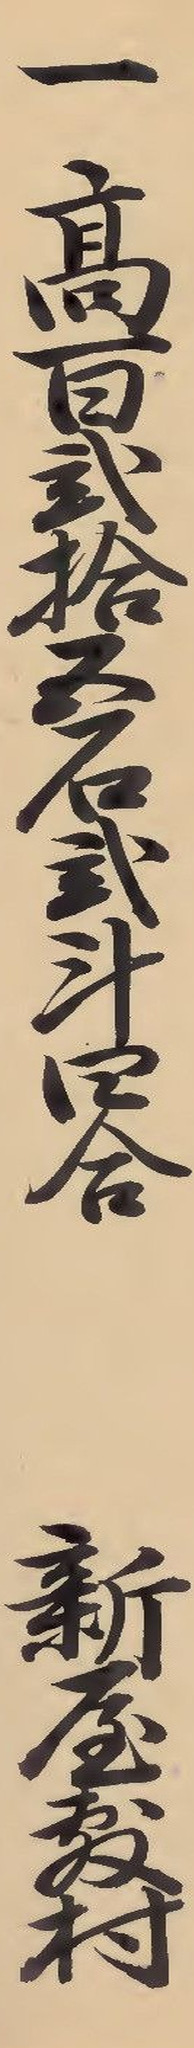一高百弐拾五石弐斗四合新屋敷村
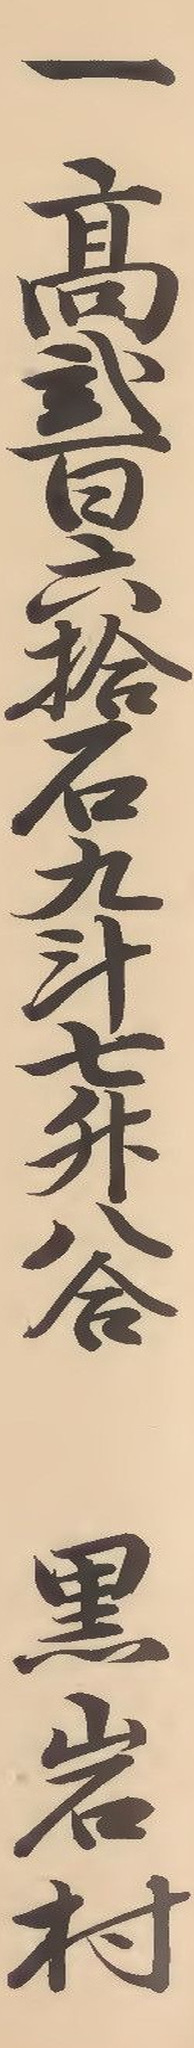一高弐百六拾石九斗七升八合黒岩村
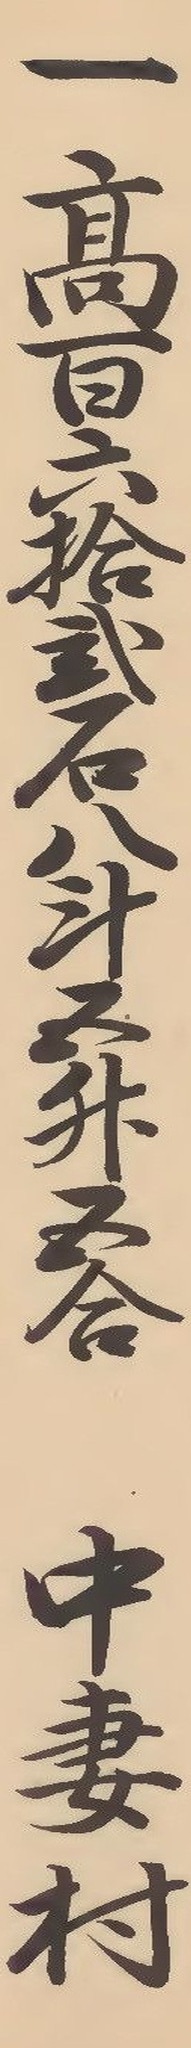一高百六拾弐石八斗五升五合中妻村
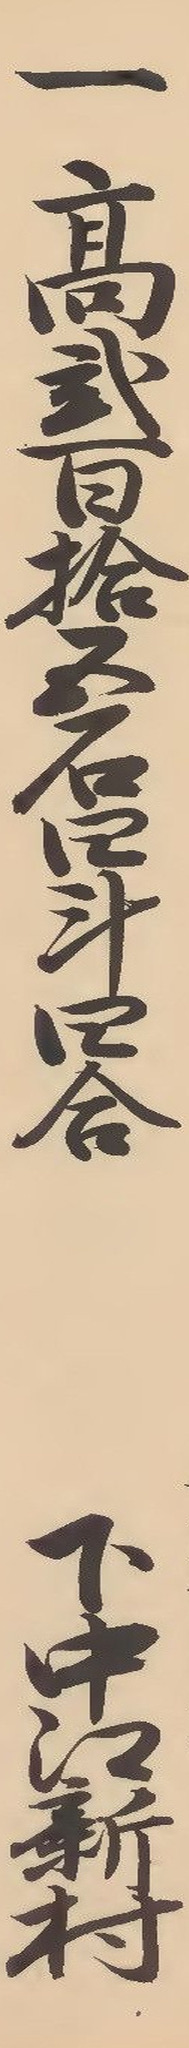一高弐百拾五石四斗四合下中江新村
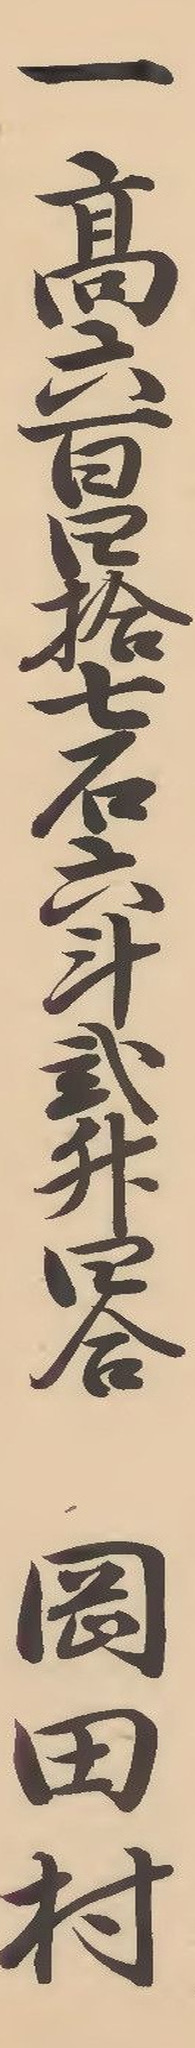一高六百四拾七石六斗弐升四合岡田村

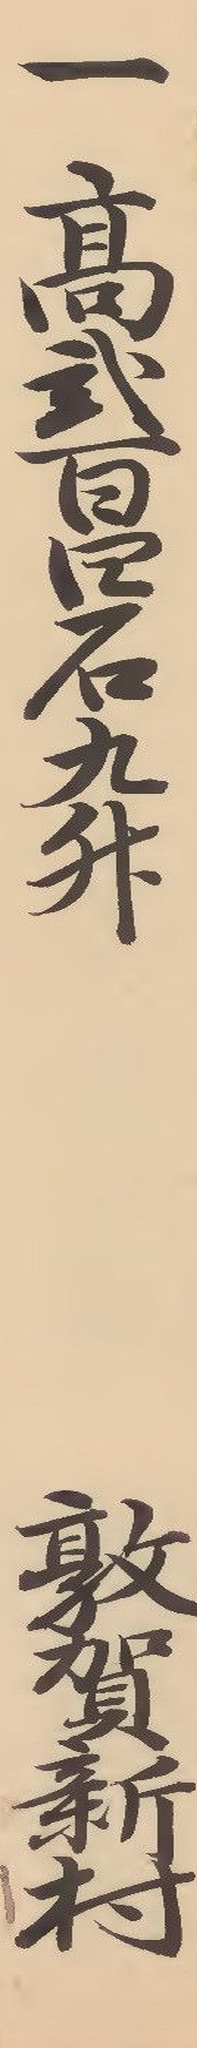一高弐百四石九升敦賀新村
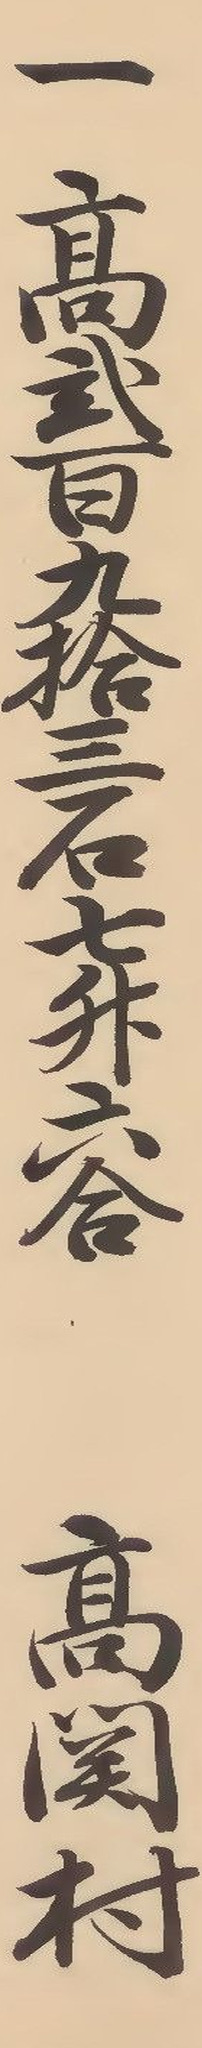一高弐百九拾三石七升六合高関村
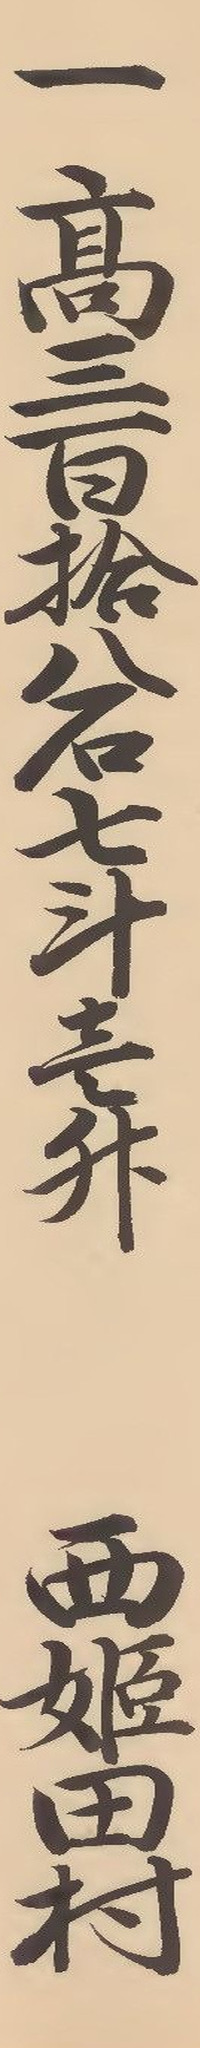一高三百拾八石七斗壱升西姫田村
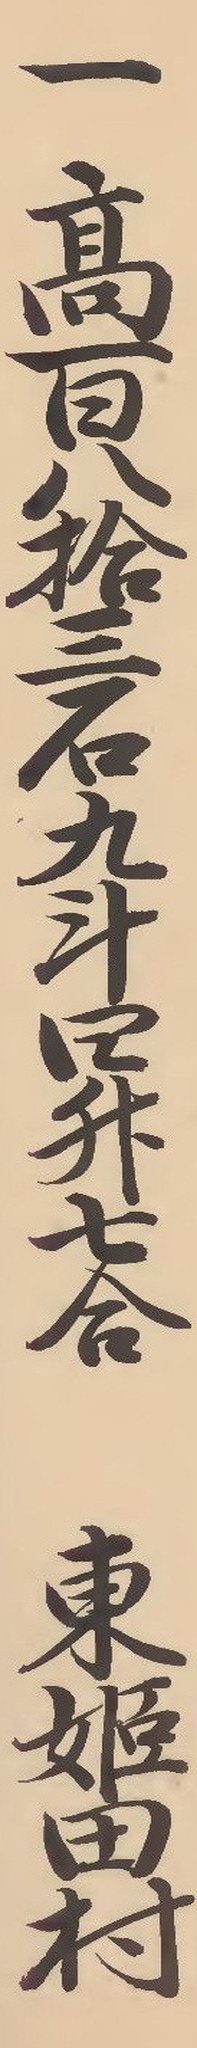一高百八拾三石九斗四升七合東姫田村
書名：越後国郷帳　下
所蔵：国立公文書館 National Archives of Japan
